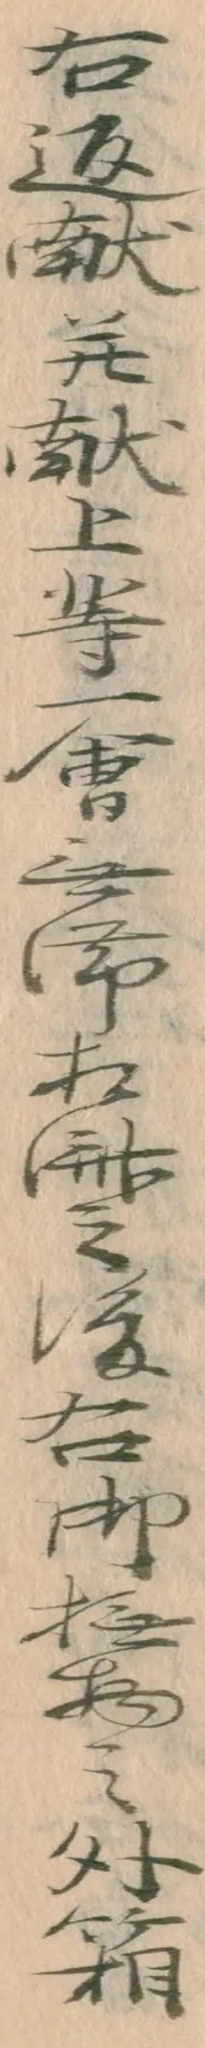右返献并献上等一會無滞相済之後右御撫物之外箱
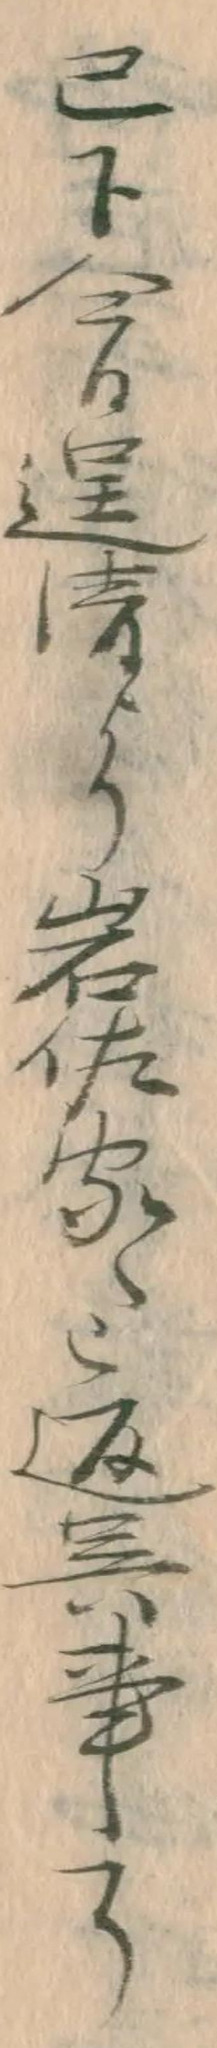已下今日逞清より岩佐家へ被返呉候事了
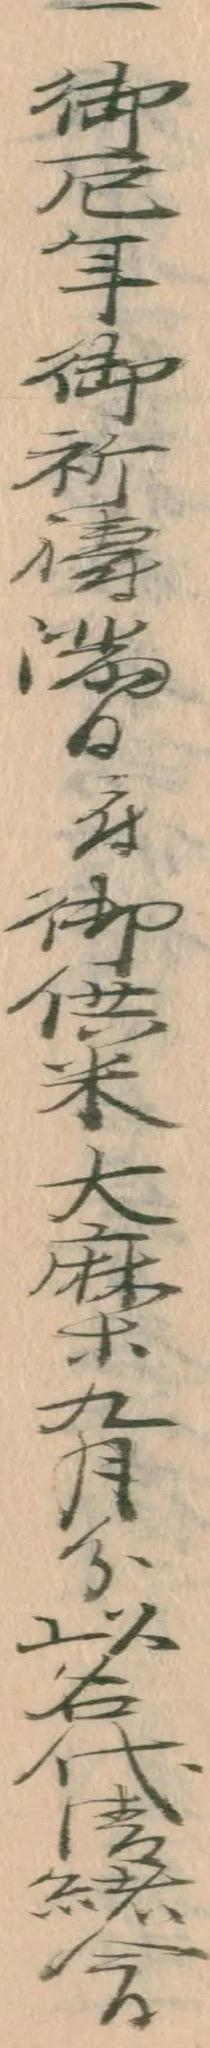一御厄年御祈祷満日ニ付御供米大麻等九月分以名代清緒今日
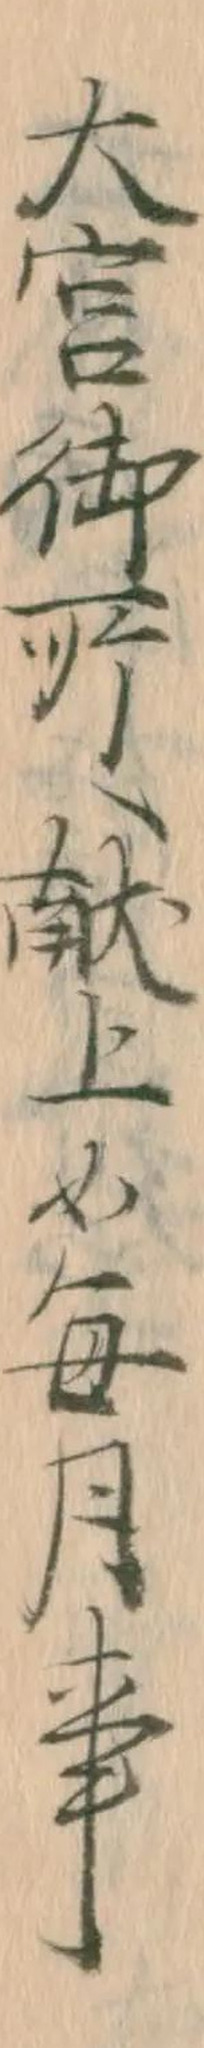大宮御所へ献上如毎月事
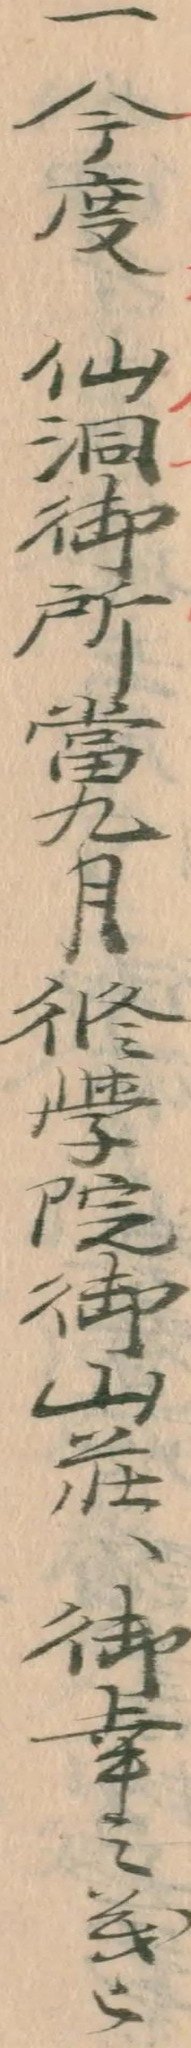一今度仙洞御所當九月修學院御山荘へ御幸之義被
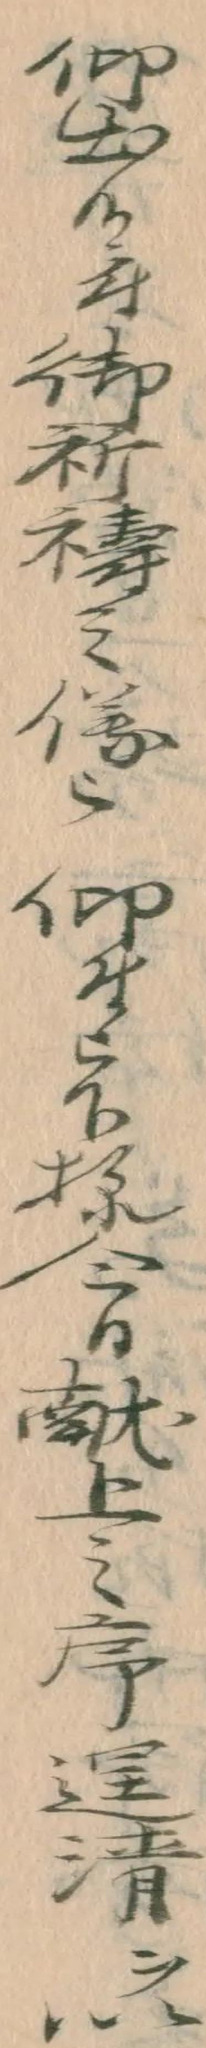仰出候ニ付御祈祷之儀被仰付被下候様今日献上之序逞清ヲ以
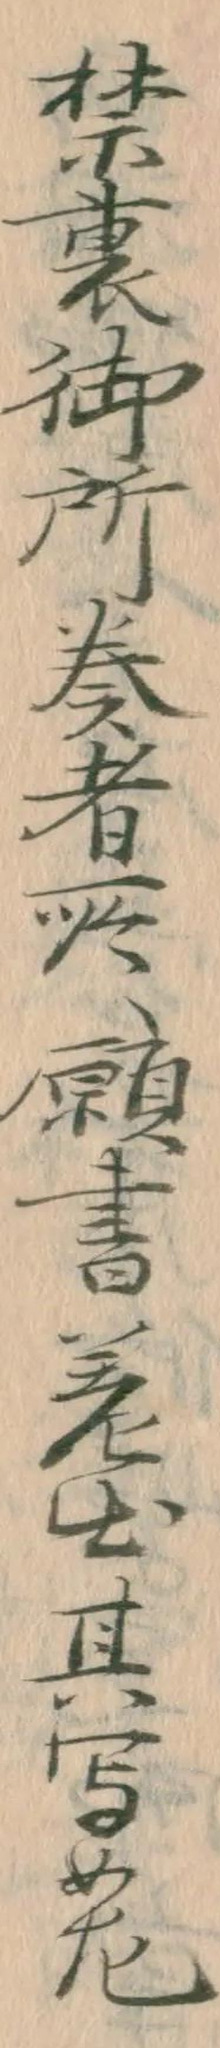禁裏御所奏者所へ願書差出其写如左
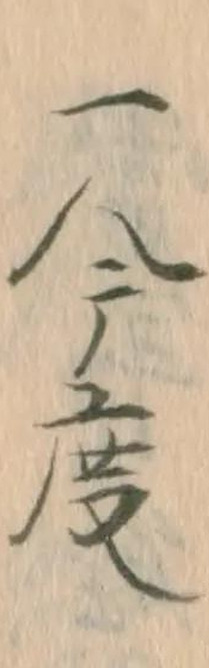一今度
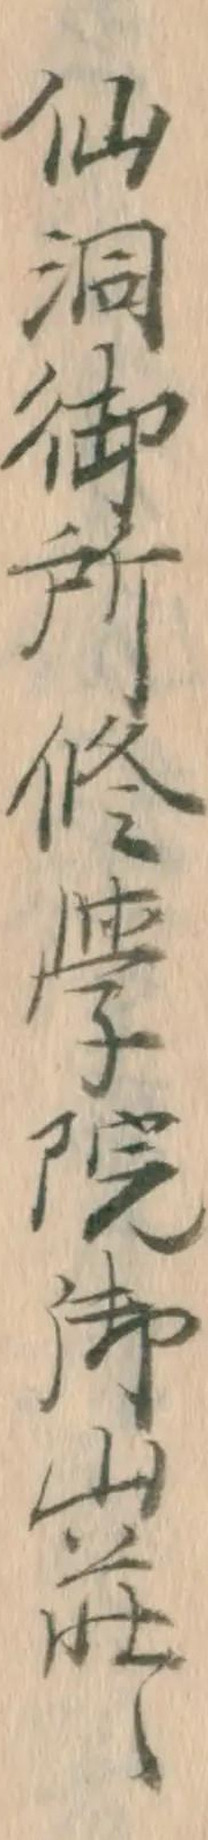仙洞御所修學院御山荘へ
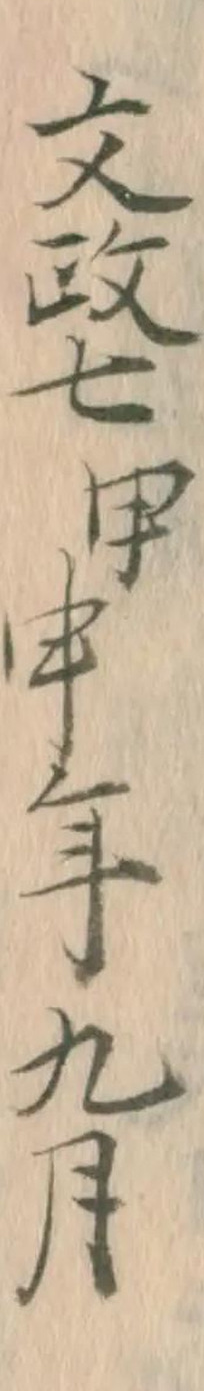文政七甲申年九月
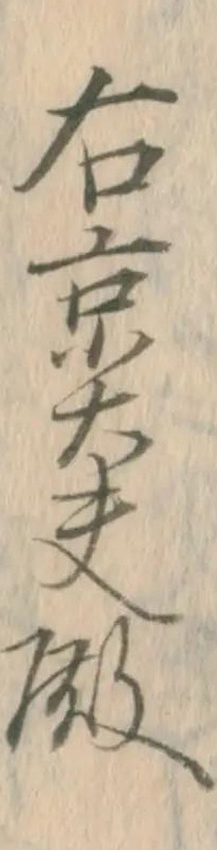右京大夫殿
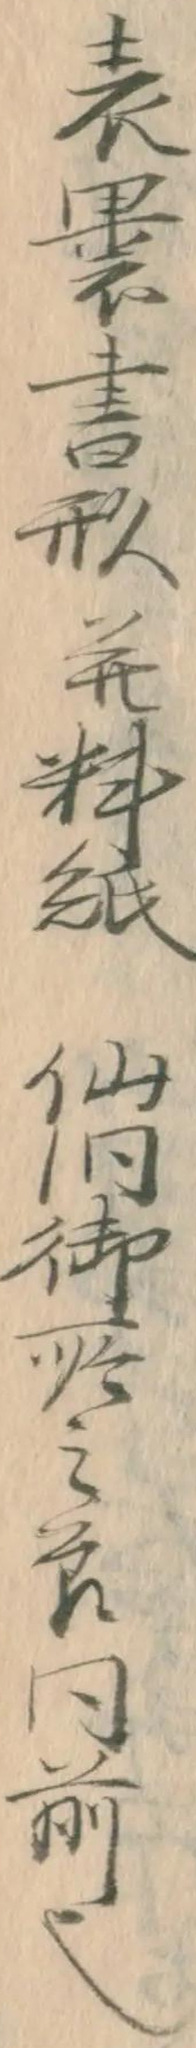表褁形形幷料紙仙洞御所之節同前也

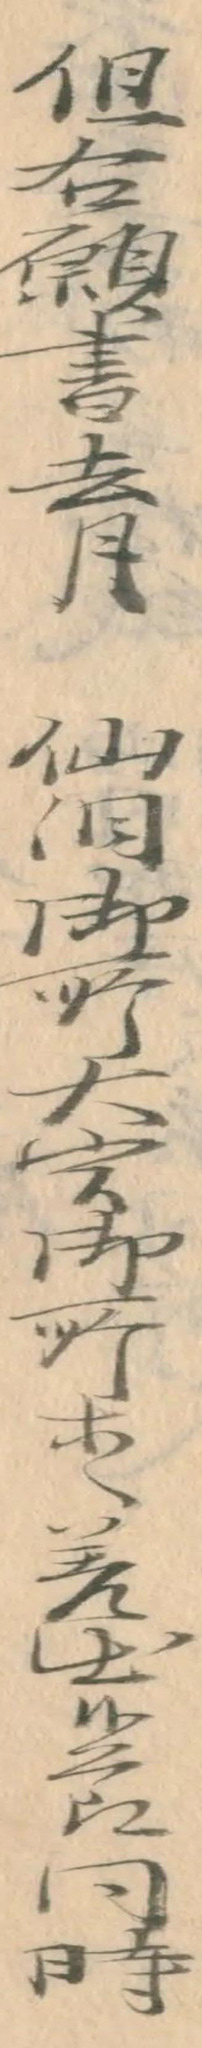但右願書去月仙洞御所大宝御所等へ差出候節同時
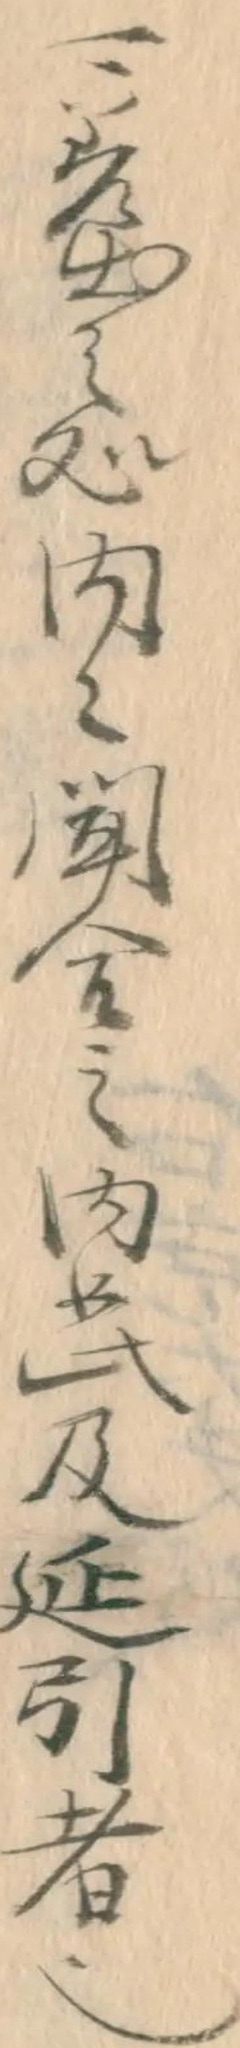可差出之処内々聞合之内如此及延引者也
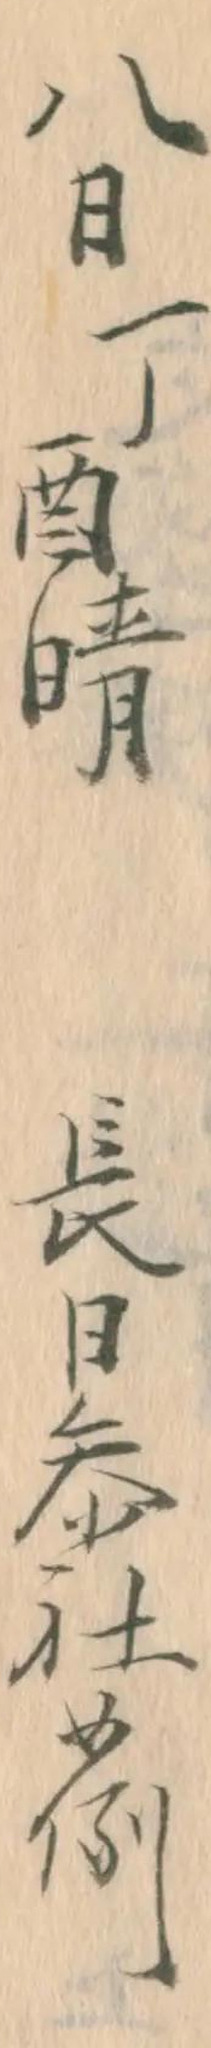八日丁酉晴長日参社如例
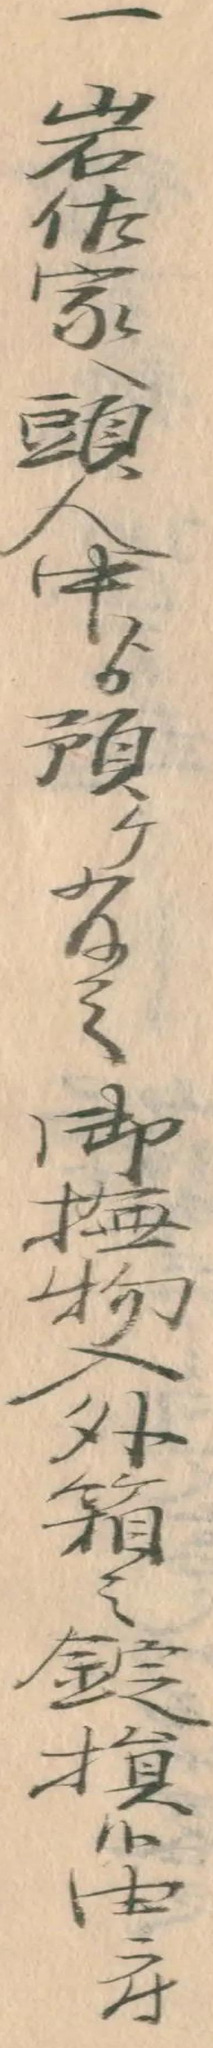一岩佐家へ頭人中ゟ預ケ有之御撫物入外箱之錠損候由ニ付
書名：賀茂社記録. 第74冊
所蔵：国立国会図書館 National Diet Library, JAPAN
